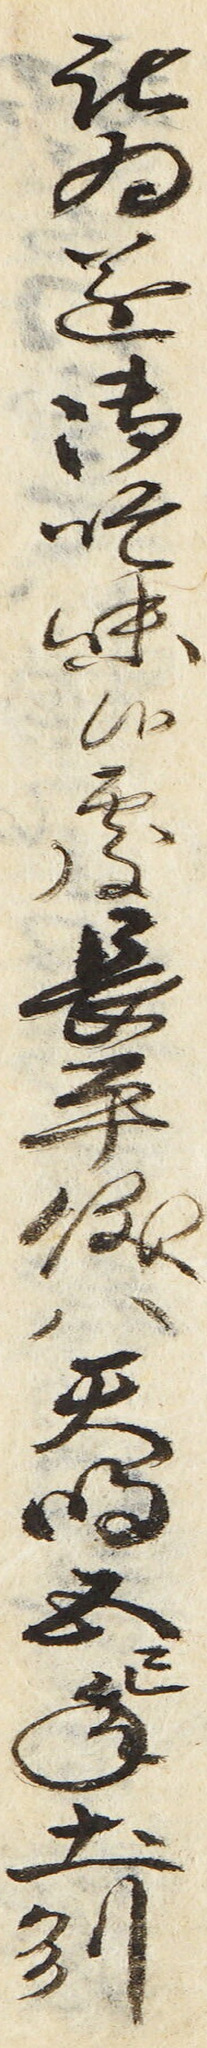被為遂御吟味候処長平儀ハ天明五巳年土州
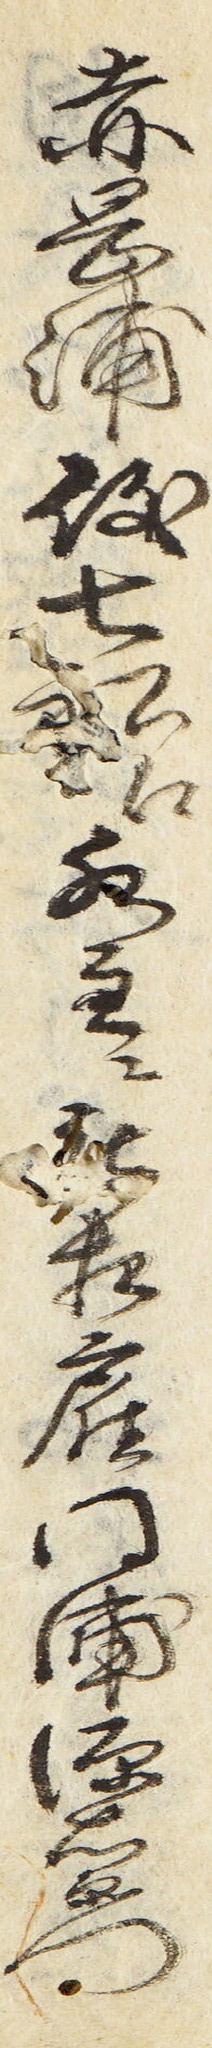赤岡浦儀七船江水主ニ被相雇同浦源右衛門
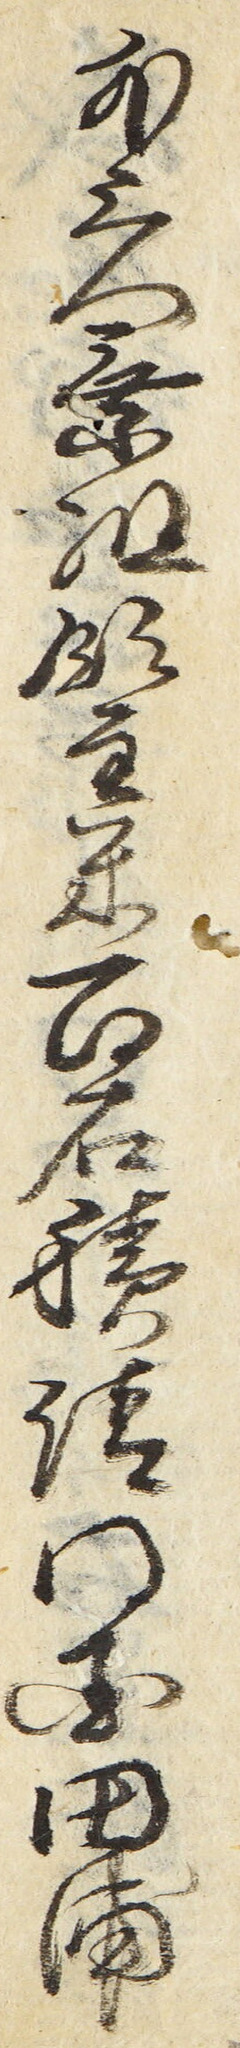外三人乗組領主米百石積請同国田浦

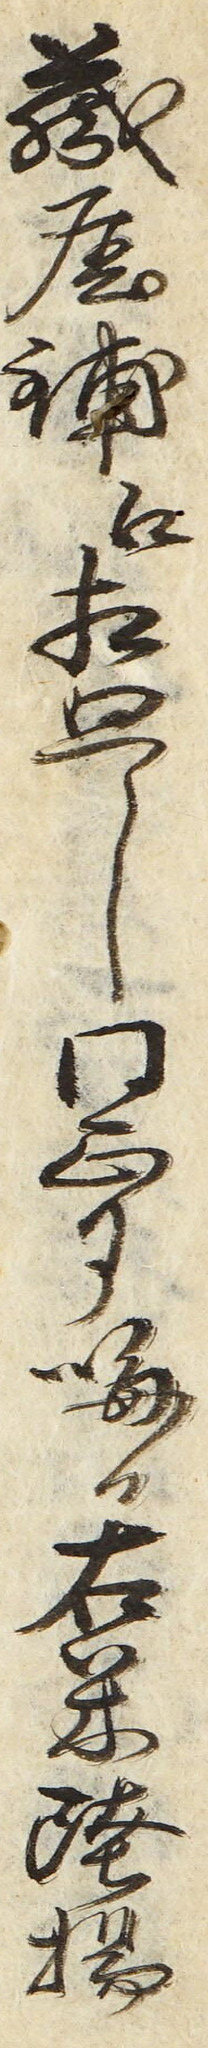蔵屋敷江相廻し同正月晦日右米陸揚
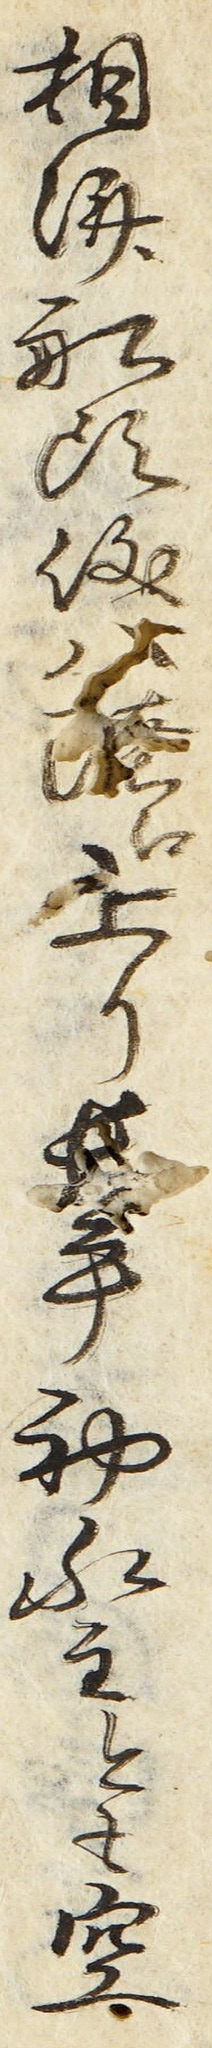相済船頭儀ハ陸江上り長平初水主とも空
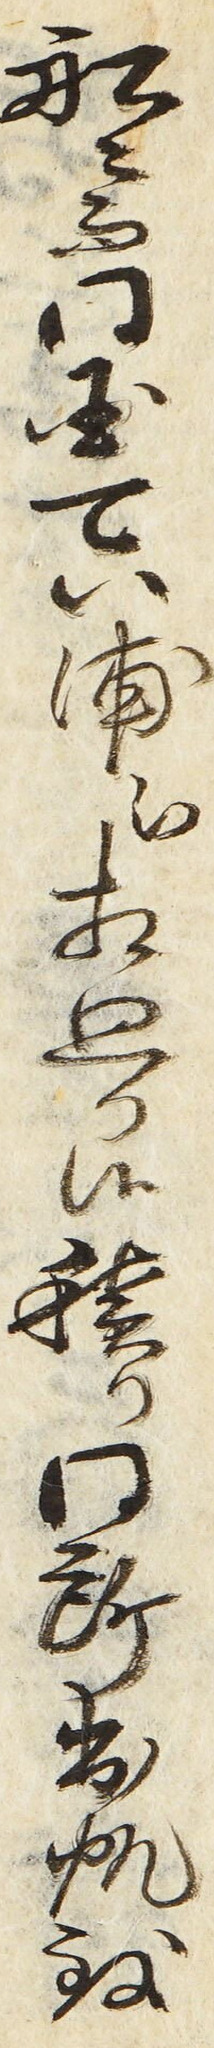船ニ而同国てい浦江相廻り候積り同所出帆致
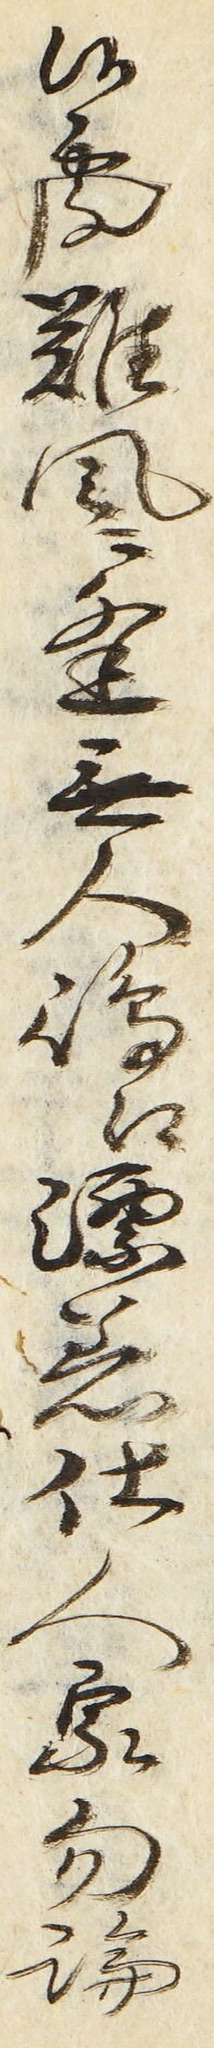候処難風ニ逢無人嶋江漂着仕人家勿論
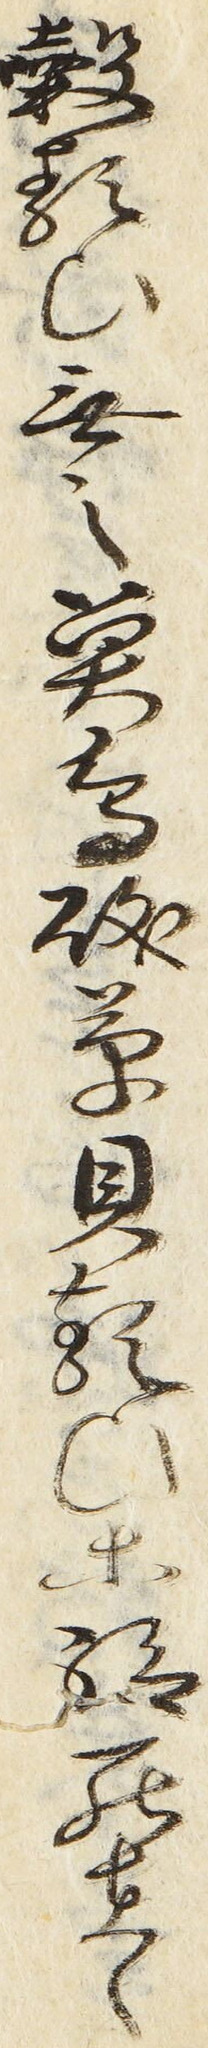穀類ひ無之魚鳥磯草貝類ひ等給罷在候
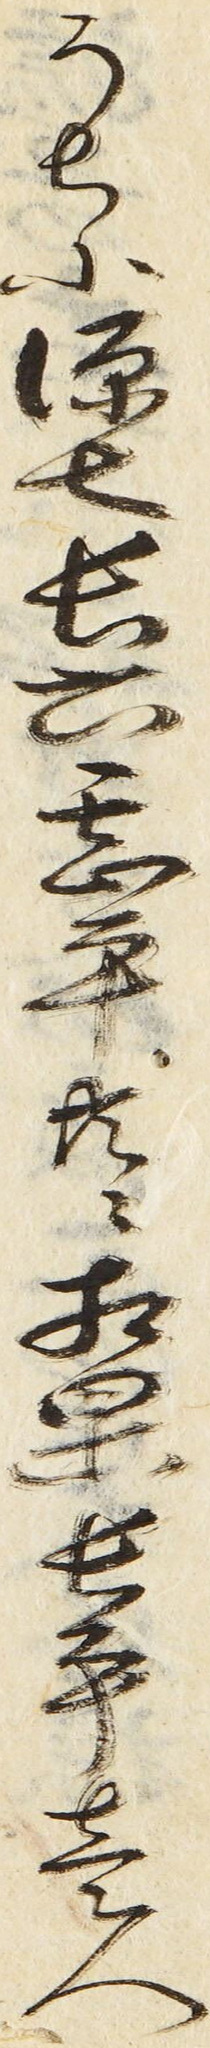うちに源七長六甚平共ニ相果長平壱人
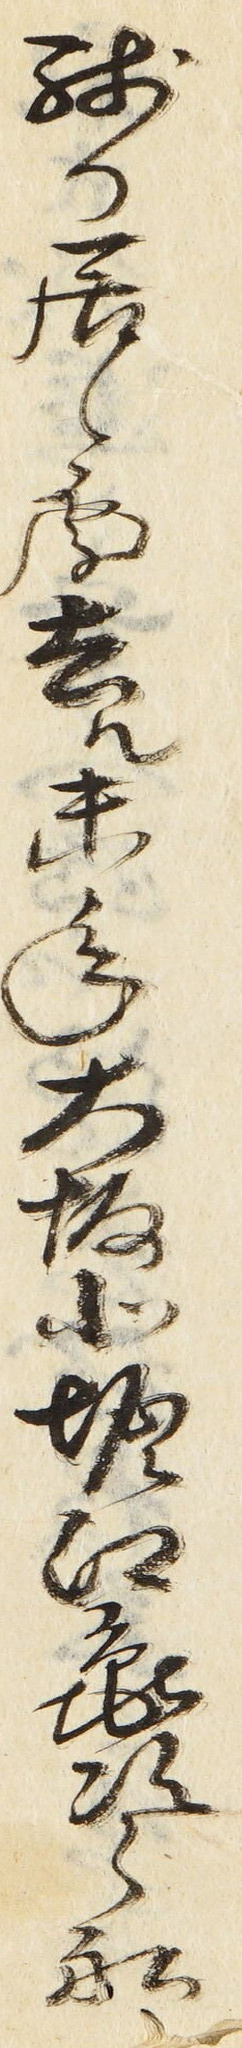残り居候処去ル未年大坂北堀江亀次郎船
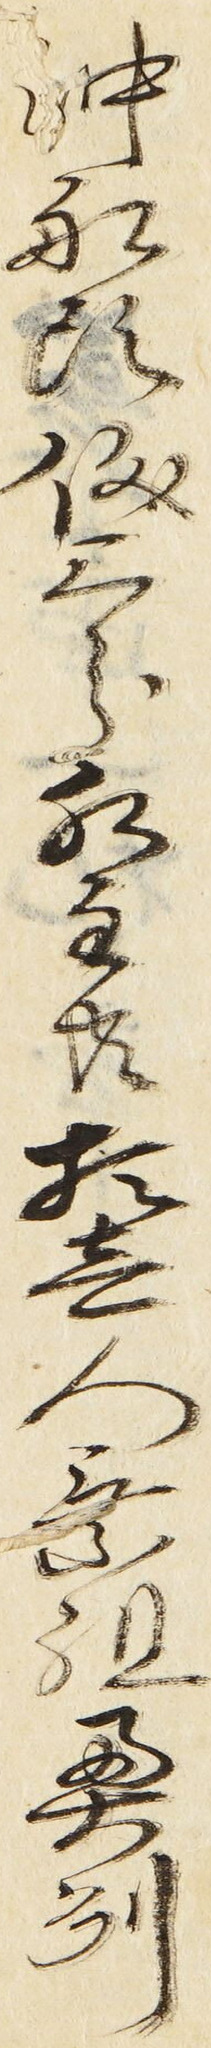沖船頭儀三郎水主共拾壱人乗組奥州
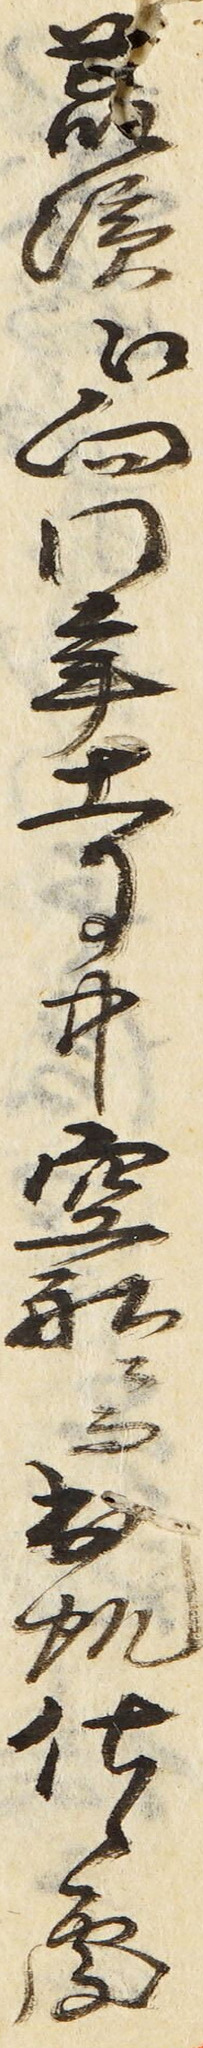荒浜江向同年十一月中空船ニ而出帆仕候処
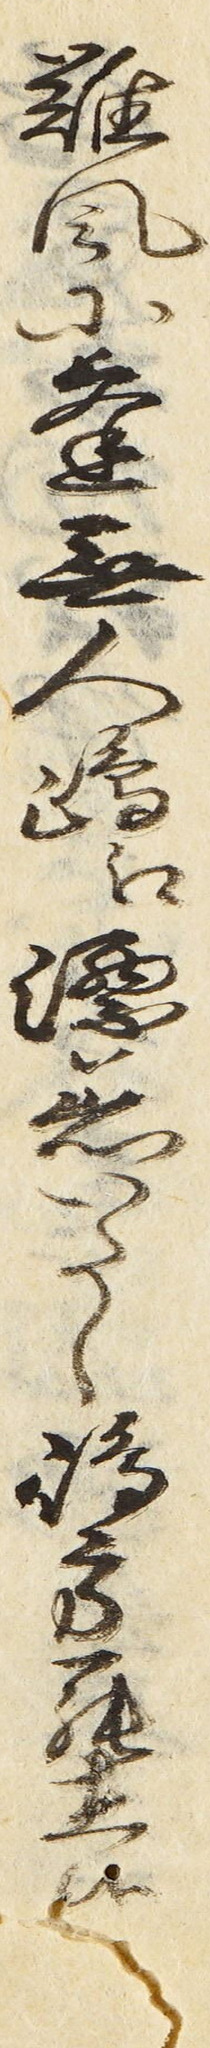難風に逢無人嶋江漂着いたし嶋方罷在候
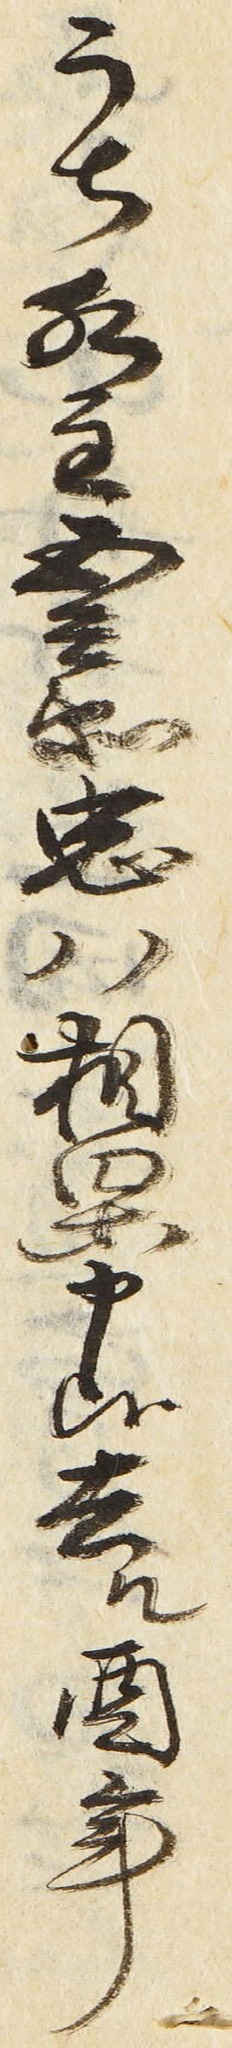うち水主五兵衛忠八相果申候去ル酉年
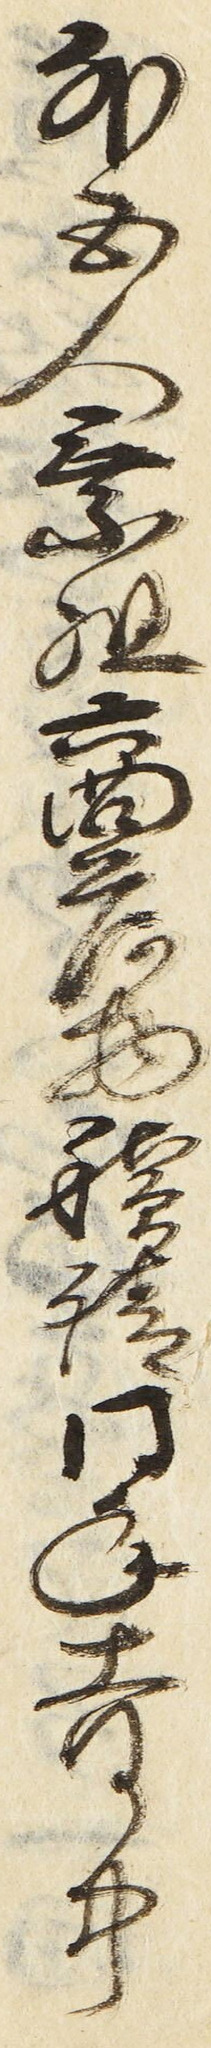外五人乗組商荷物積請同年十一月中
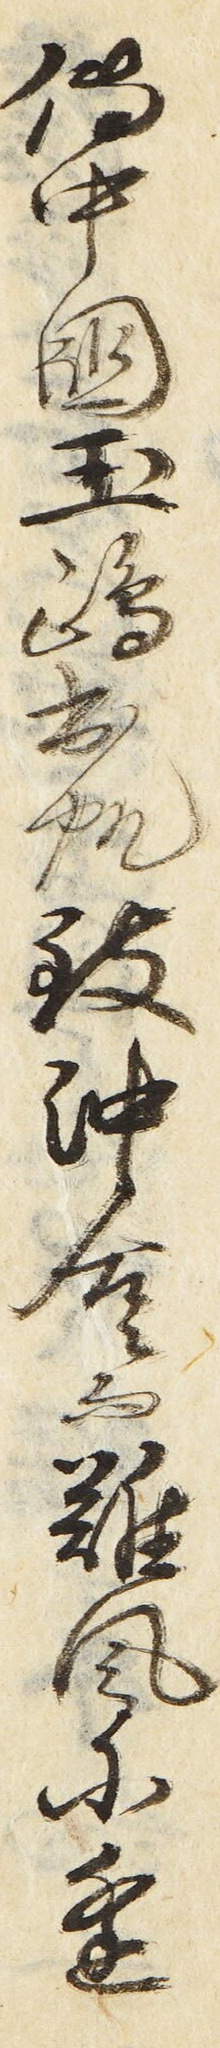伝中国玉嶋出帆致沖合ニ而難風に逢
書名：漂流一件上書
